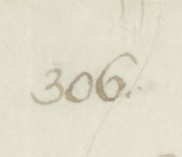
306.
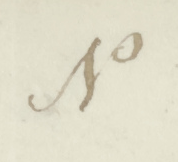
N
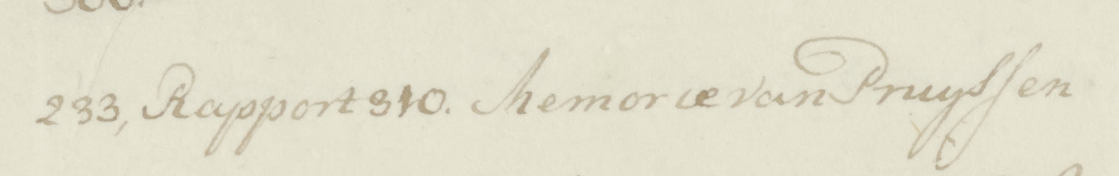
233, Rapport 310. Memorie van Pruyssen
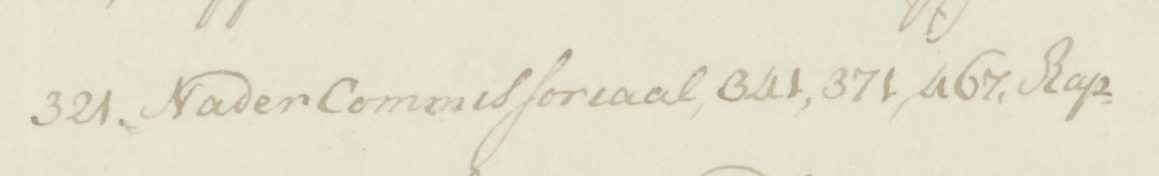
321. Nader Commissoriaal, 341, 371, 467, Rap„
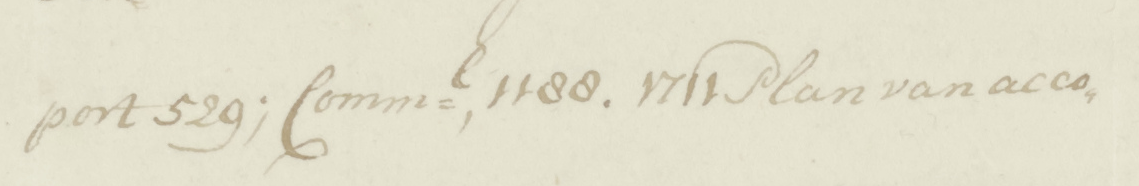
port 529; Comml., 1188. 1711. Plan van acco,,
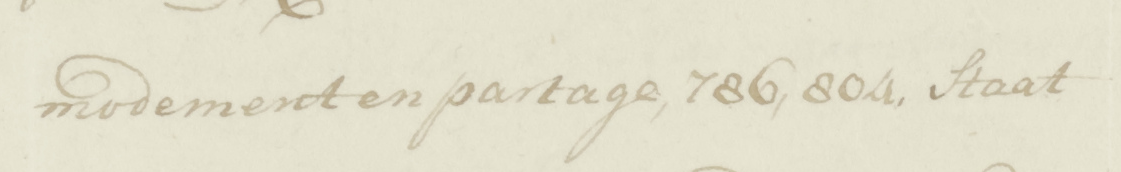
modement en partage, 786, 804, Staat
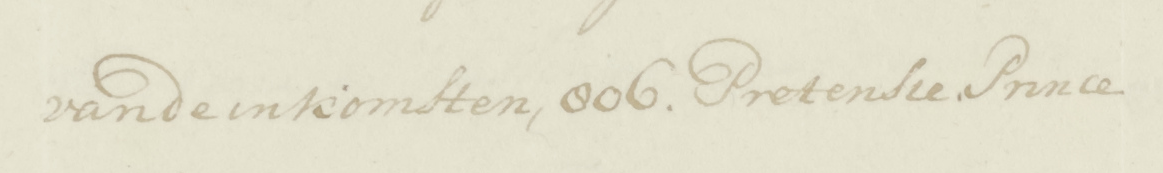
vande inkomsten, 806. Pretensie Prince
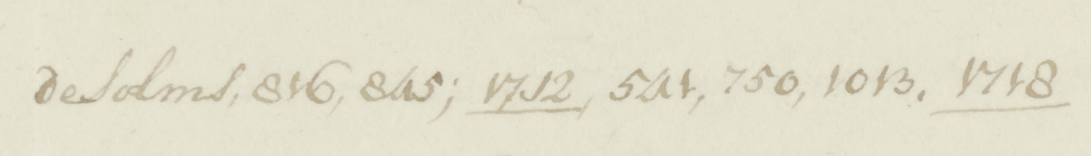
de Solms, 816, 845; 1712, 541, 750, 1013, 1718
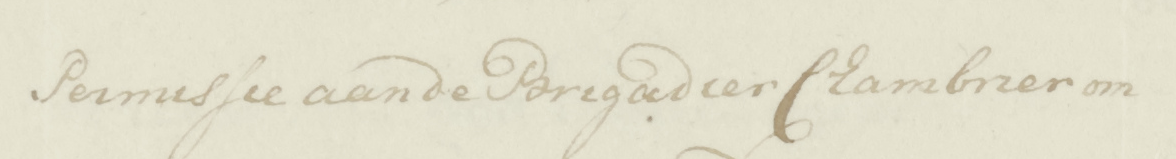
Permissie aan de Brigadier Chambrier om
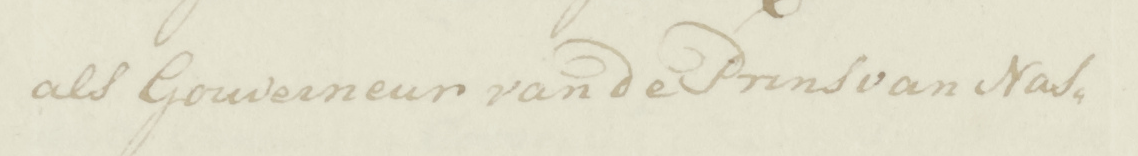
als Gouverneur van de Prins van Nas,,
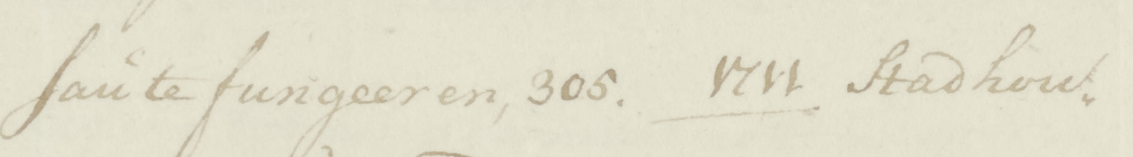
sau te fungeeren, 305. 1711 Stadhou„
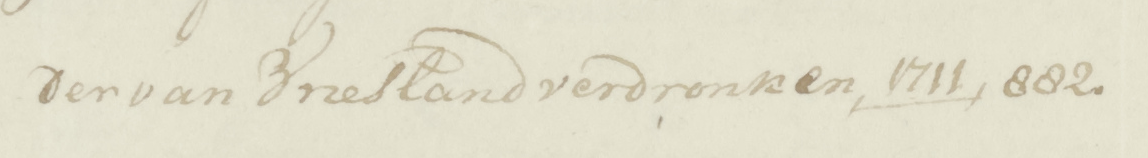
der van Vriesland verdronken, 1711, 882.
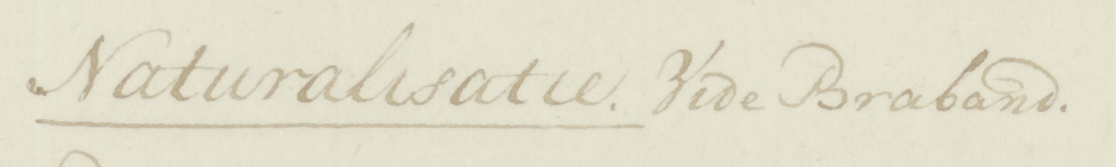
Naturalisatie. Vide Braband.
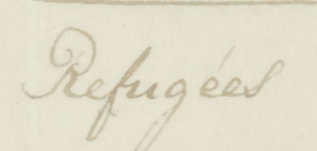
Refugées
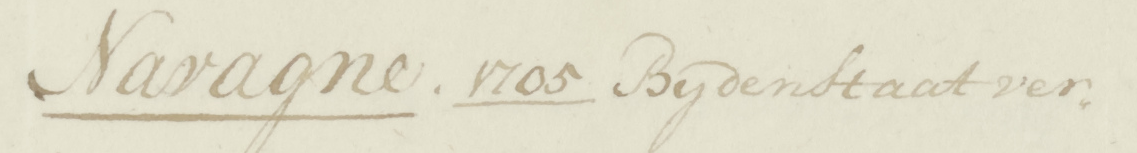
Navagne. 1705 Bij den staat ver,,
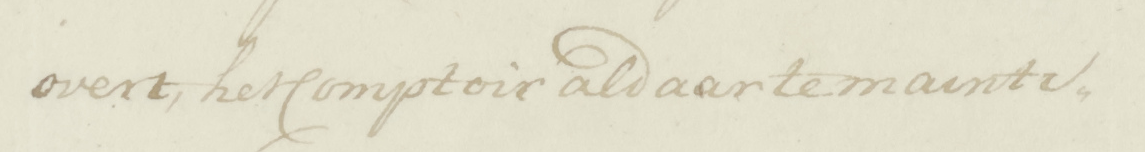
overt, het comptoir aldaar te mainti„
